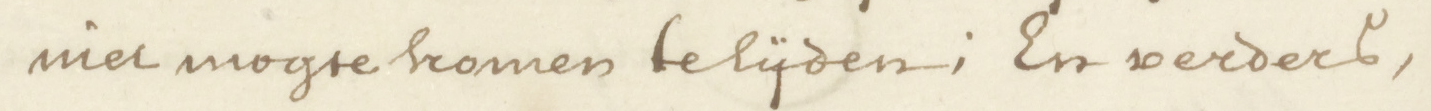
niet mogte komen te lijden; En verders,
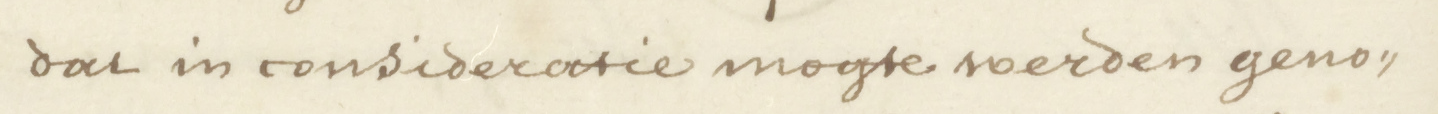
dat in consideratie mogte werden geno„
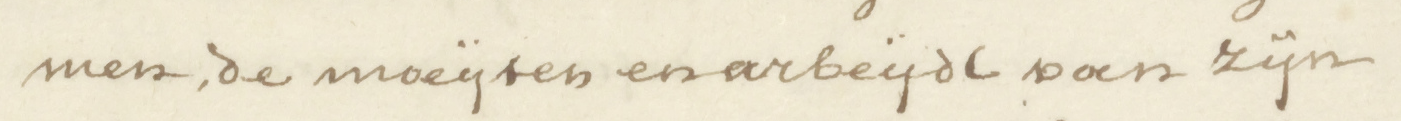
men de moeijten en arbeijdt van zijn
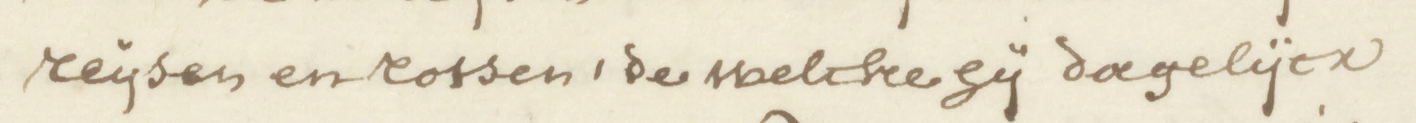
reijsen en rotsen, de welcke hij dagelijcx
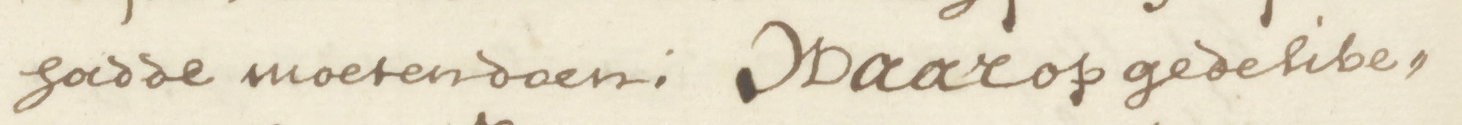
hadde moeten doen: Waarop gedelibe„
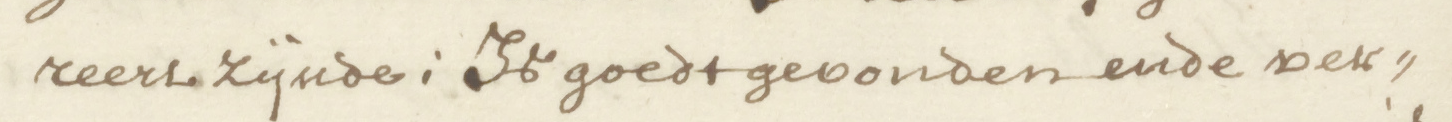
reert zijnde: Is goedtgevonden ende ver„
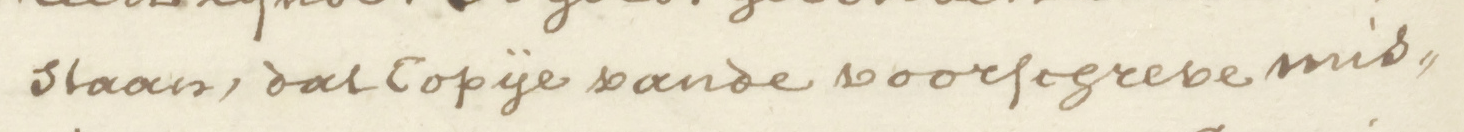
staan, dat copije vande voorschreve mis„
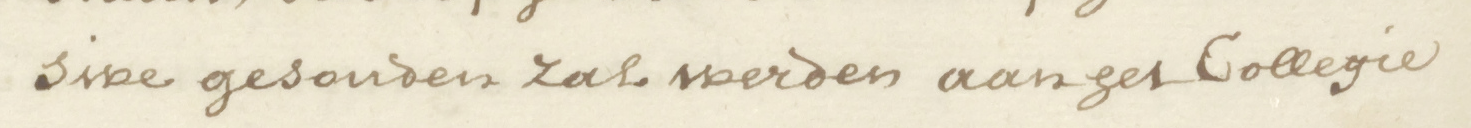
siwe gesonden zal werden aan het Collegie
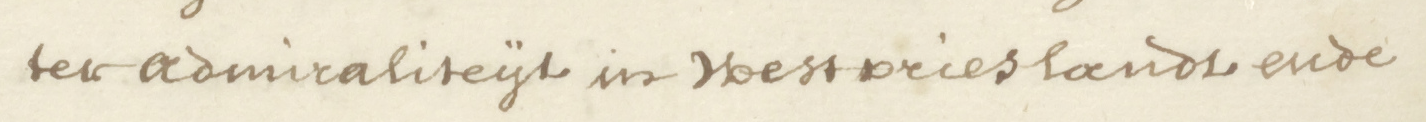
ter admiraliteijt in Westvrieslandt ende
